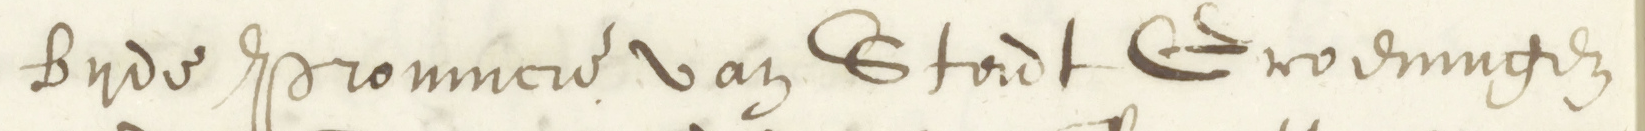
byde Prouincie van Stadt Groeningen
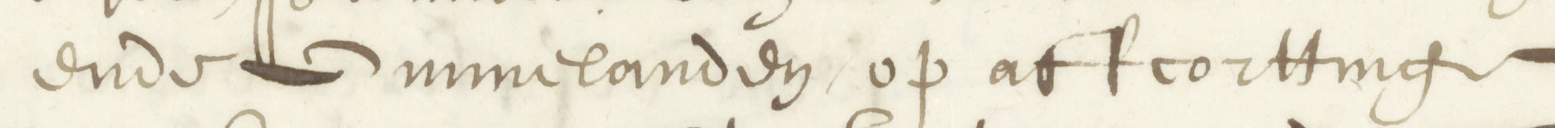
ende Ommelanden, op affcorttinge
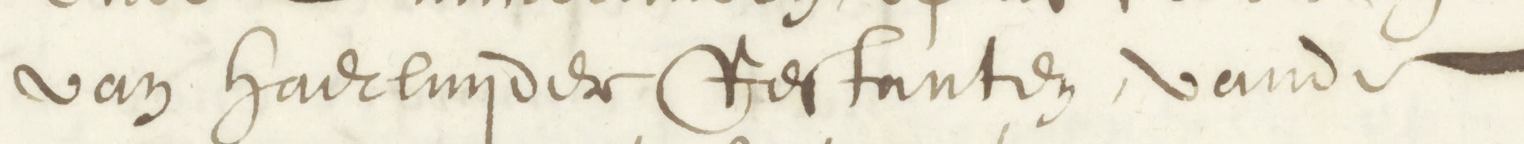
van haerluyder restanten, vande
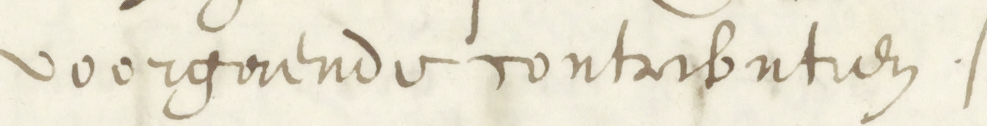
voorgaende contributien.
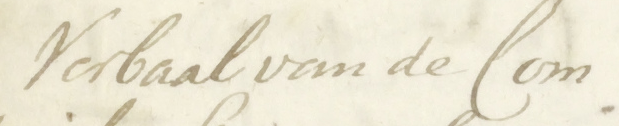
Verbaal van de Com
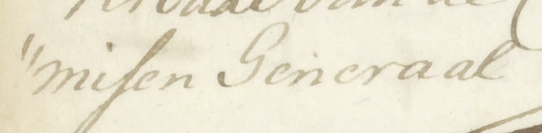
"misen Generaal
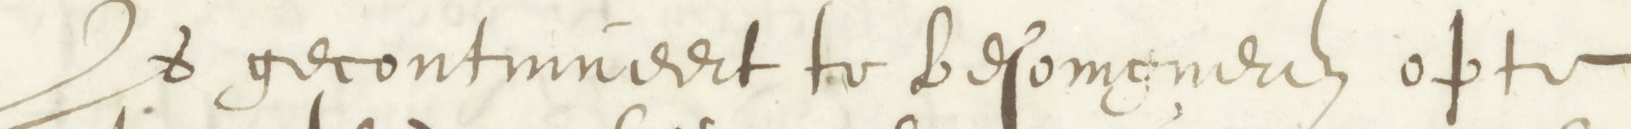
Is gecontinueert te besoingneren opte
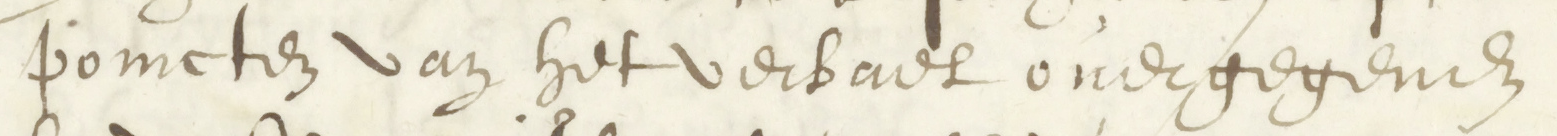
poincten van het verbael ouergegeven
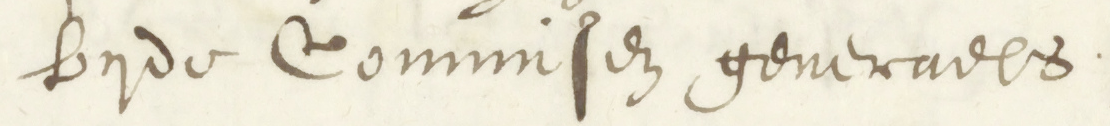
byde Commisen generaels
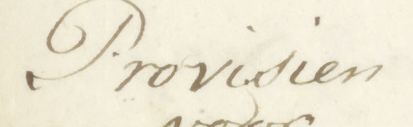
Provisien
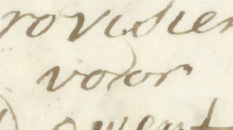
voor
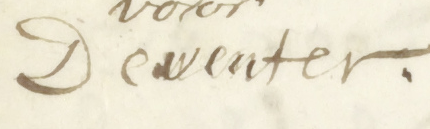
Deventer
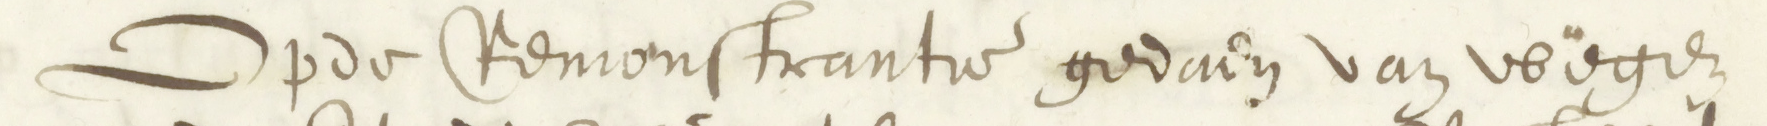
Opde Remonstrantie gedaen van wegen
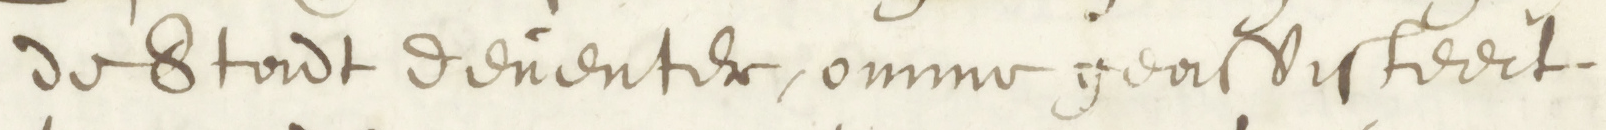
de Stadt Deuenter, omme geassisteert
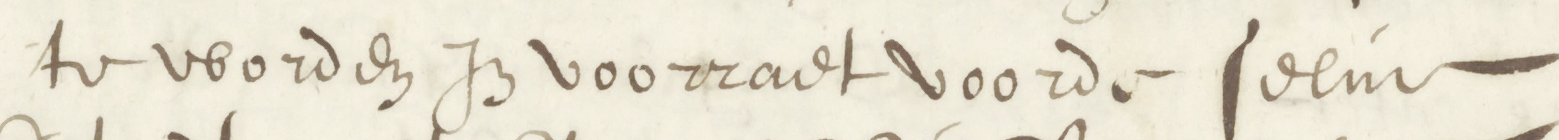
te worden In voorraet voorde selue
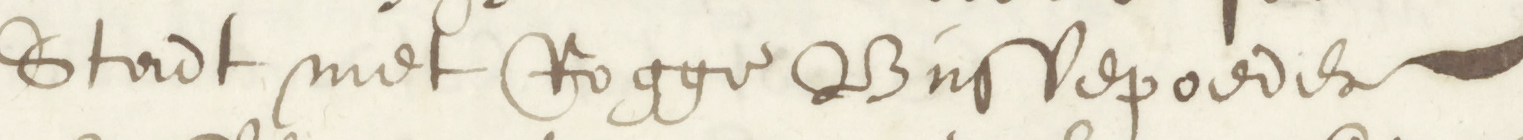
Stadt met Rogge Bussepoeder
